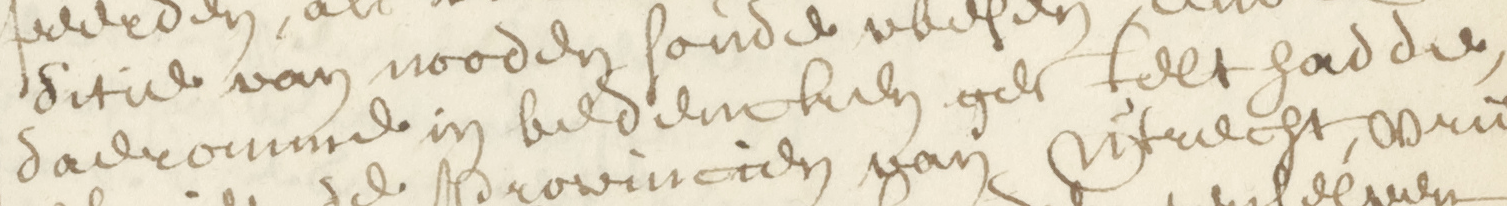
daeromme in bedencken gestelt hadde,
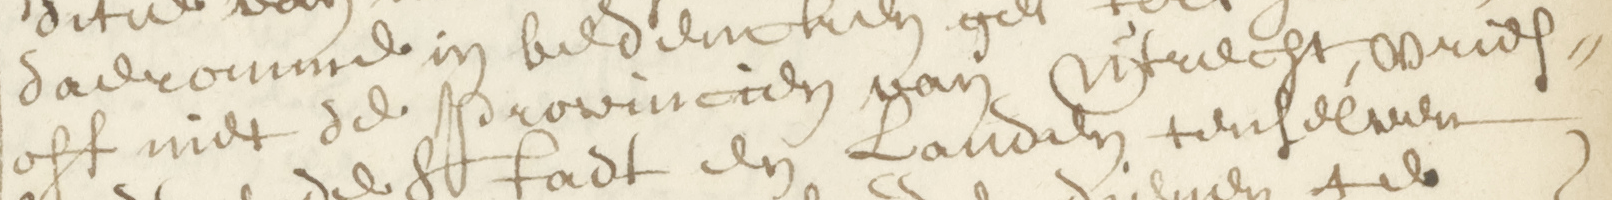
off niet de Provincien van Utrecht, Vries„
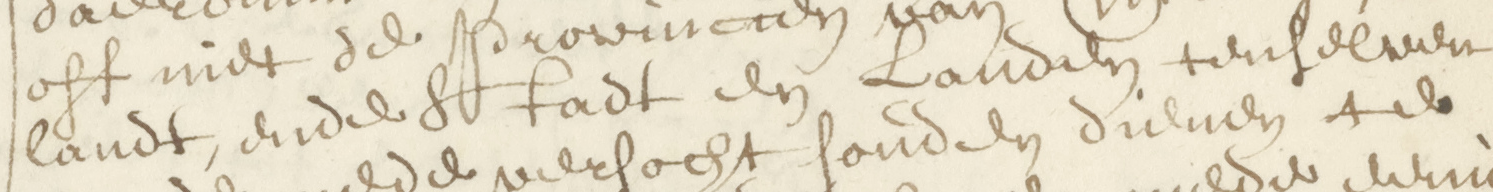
landt, ende Stadt en Landen tenselven
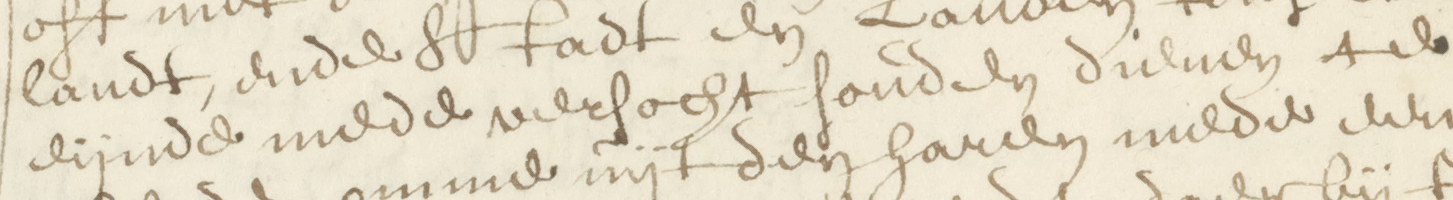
eijnde mede versocht souden dienen te
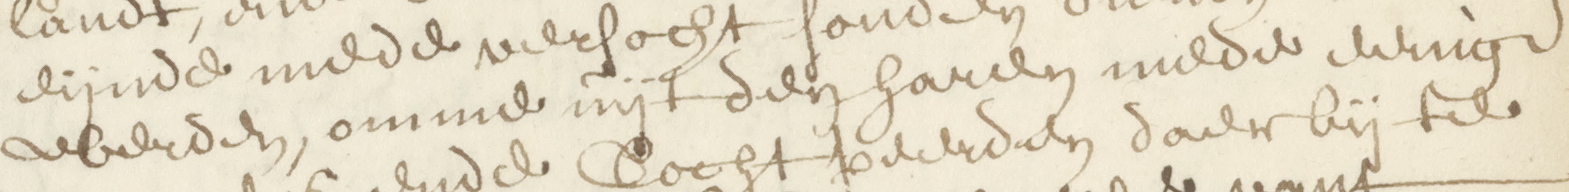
werden, omme uijt den haren mede eenige
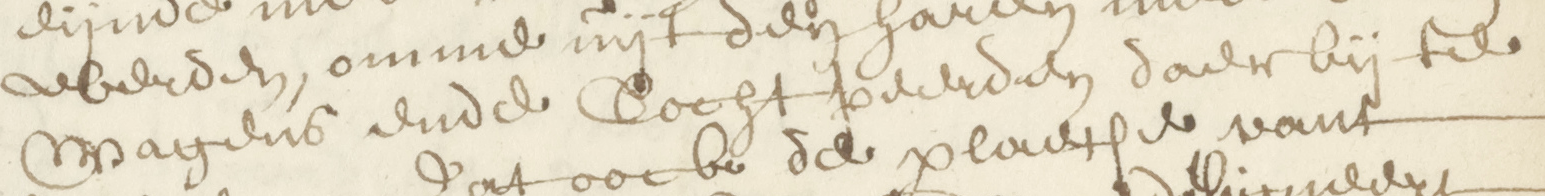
Wagens ende Tochtpeerden daerbij te
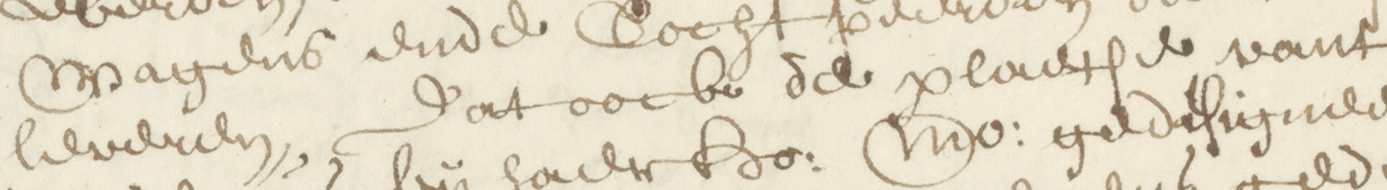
leveren, Dat oock de plaetse vant
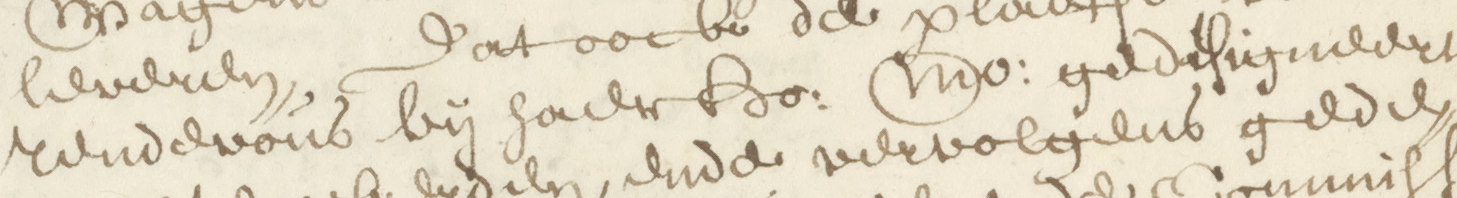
rendevous bij haer Ho:Mo: gedesigneert
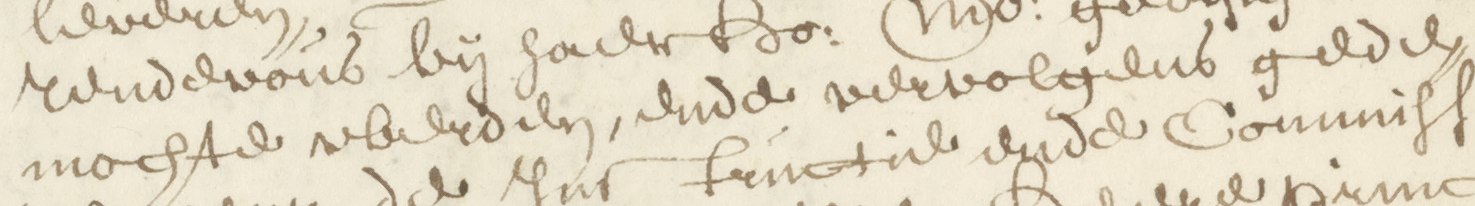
mochte werden, ende vervolgens gede„
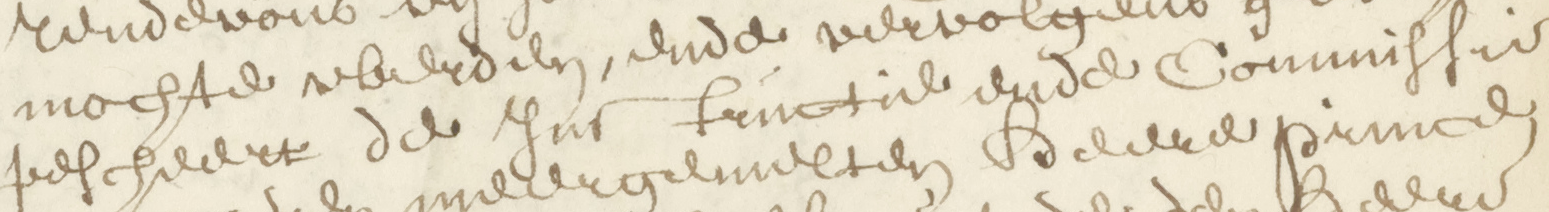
pescheert de Instructie ende Commissie
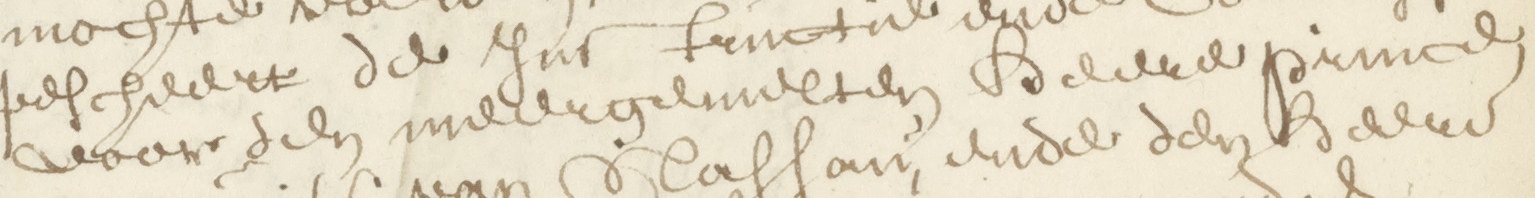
voor den meergemelten Heere Prince
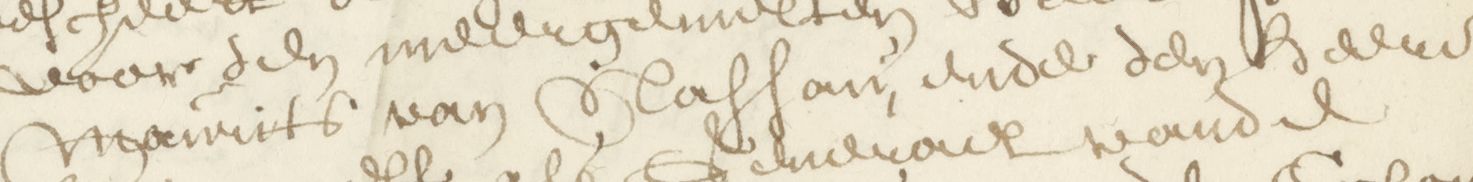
Maurits van Nassau, ende den Heere
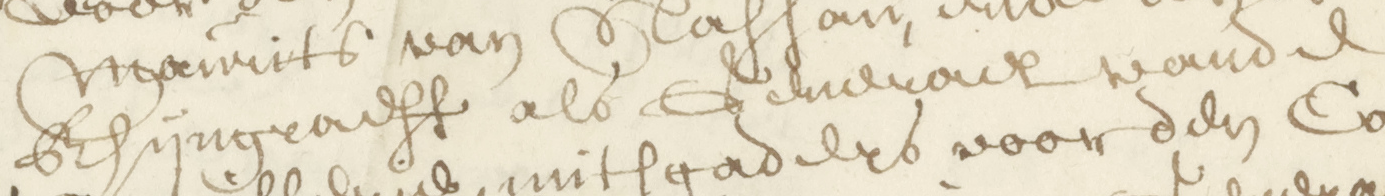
Rhijngraeff als Generael vande
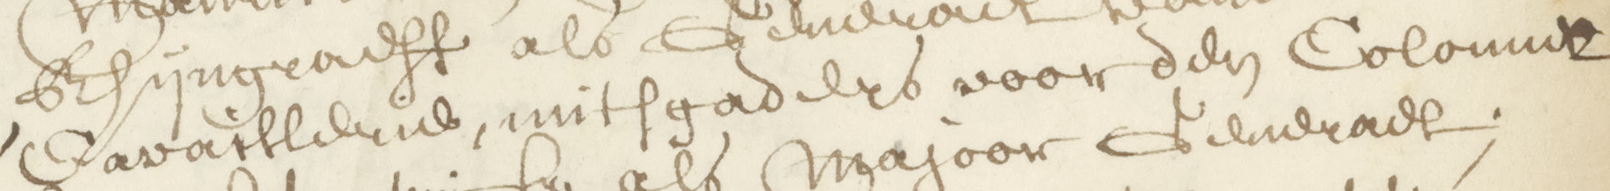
Cavaillerie, mitsgaders voor den Colonnel
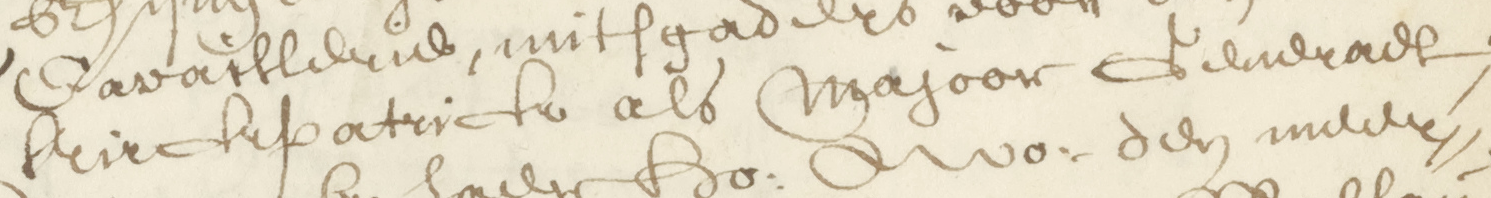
Kirckpatrick als Majoor Generael;
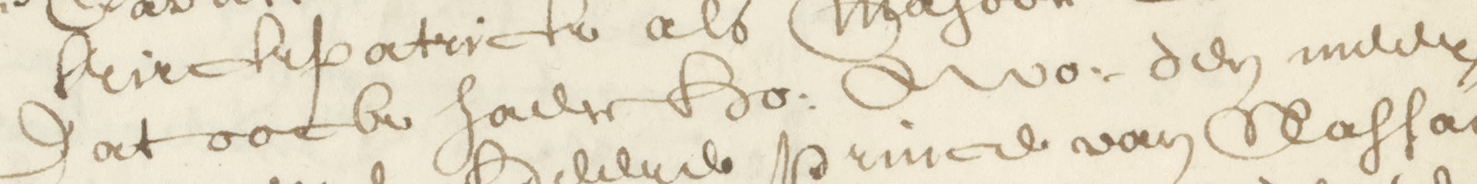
Dat oock haer Ho:Mo: den meer„
